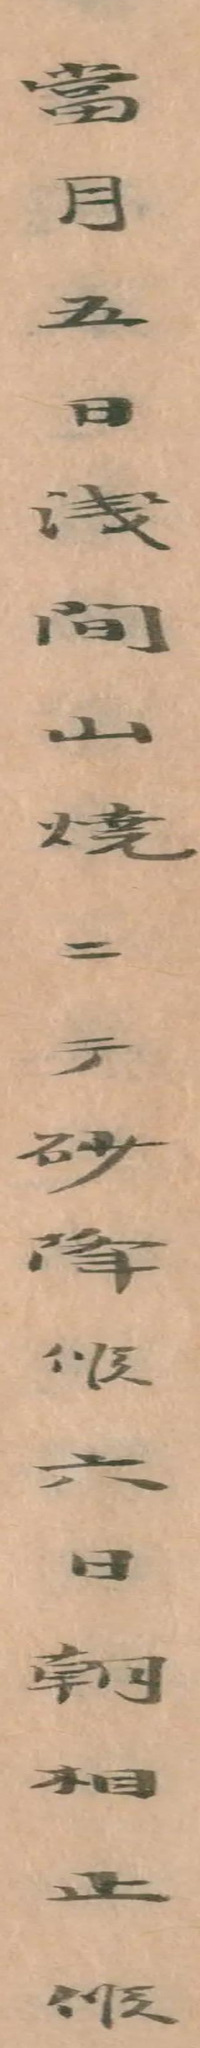一当月五日浅間山焼ニテ砂降候六日朝相止候
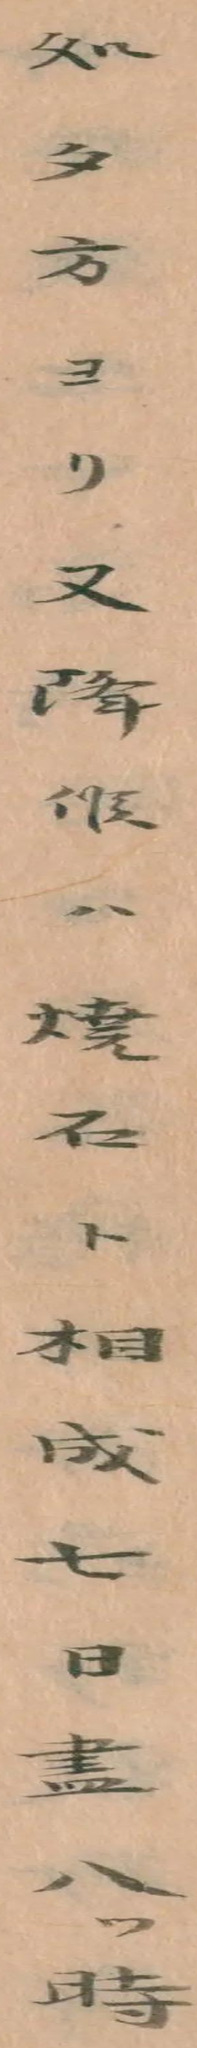所夕方ヨリ又降候ハ焼石ト相成七日晝八ッ時
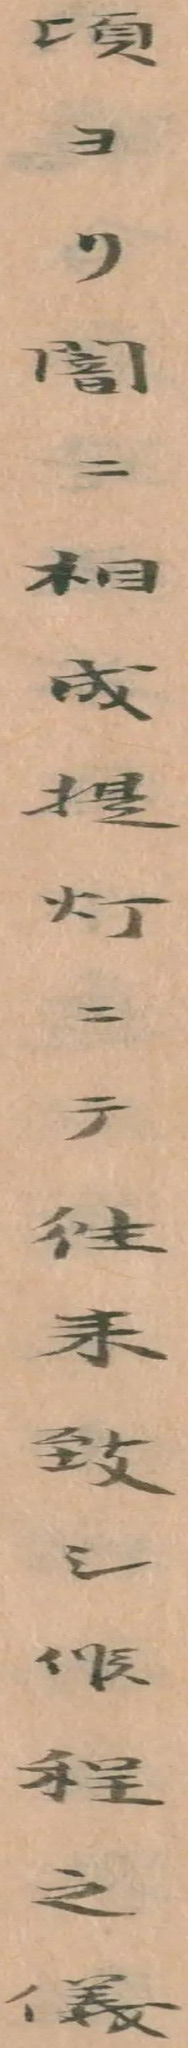頃ヨリ闇二相成提灯ニテ往来致シ候程之儀
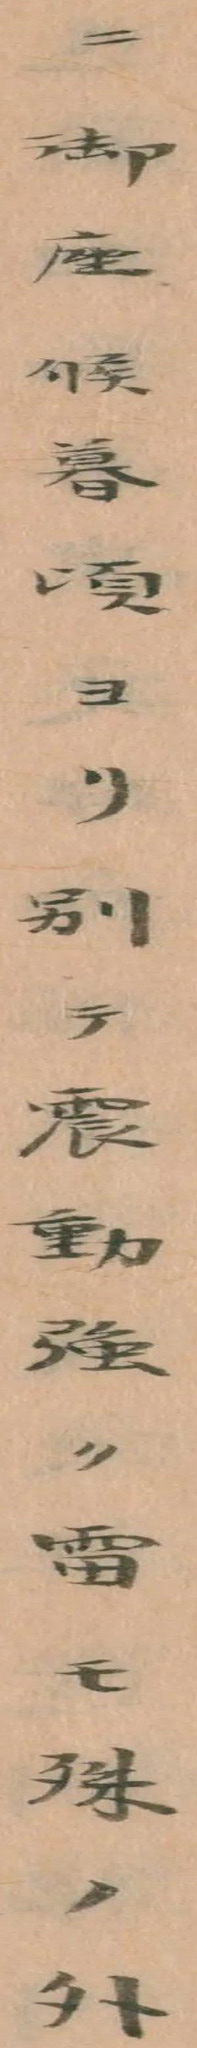二御座候暮頃ヨリ別テ震動強ク雷モ殊ノ外
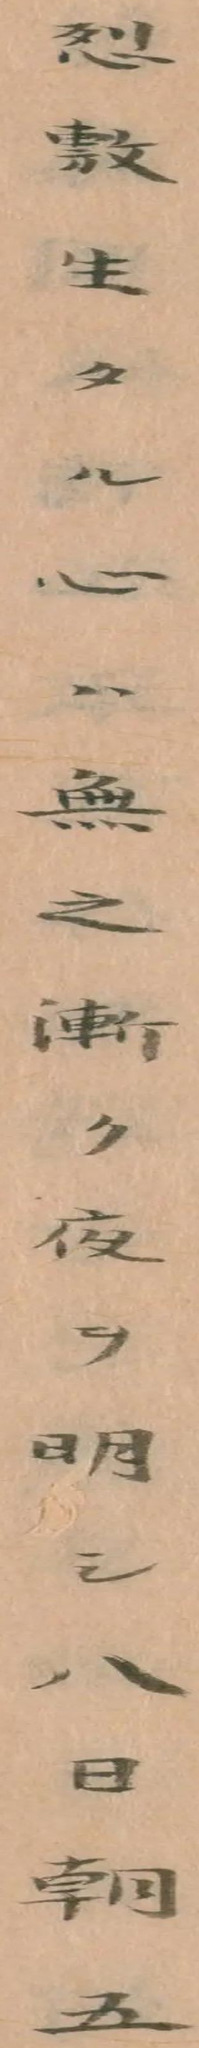烈敷生タル心ハ無之漸ク夜ヲ明シ八日朝五
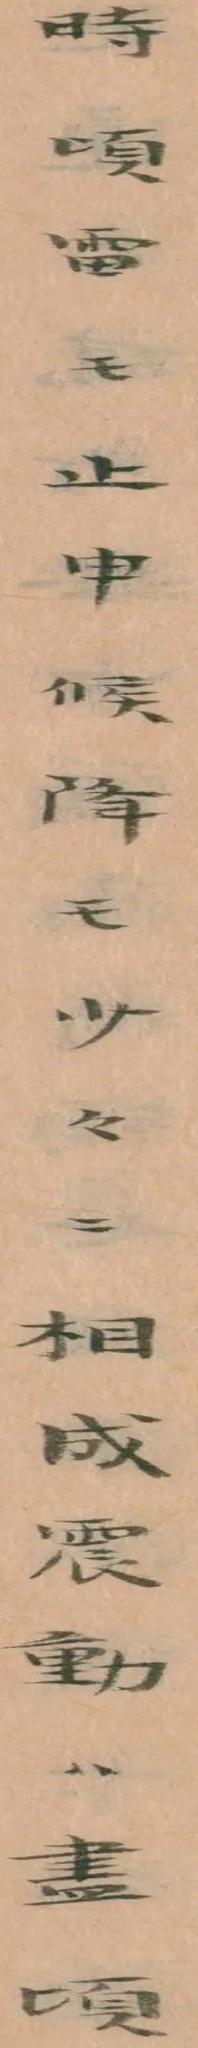時頃雷モ止申候降モ少々二相成震動ハ晝頃
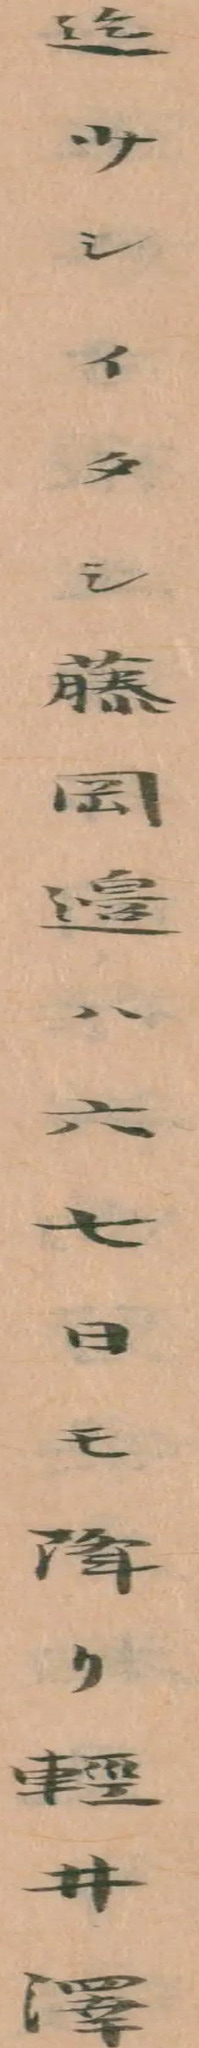迄少シイタシ藤岡辺ハ六七日モ降り軽井沢
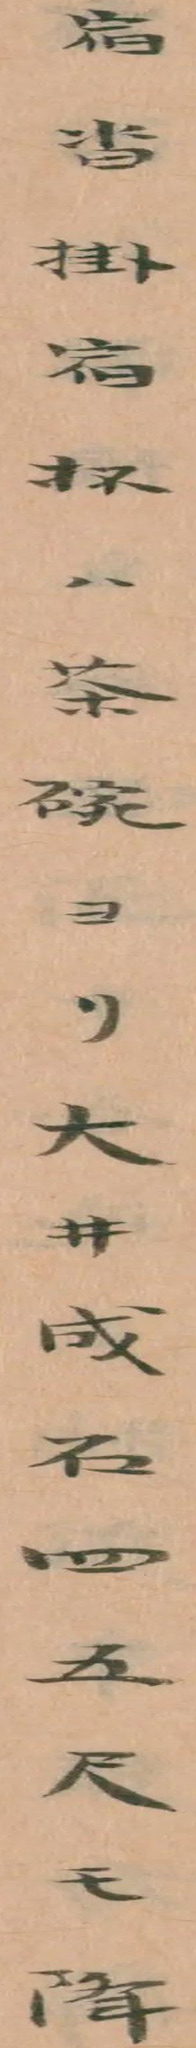宿沓掛宿抔ハ茶碗ヨリ大井成石四五尺モ降
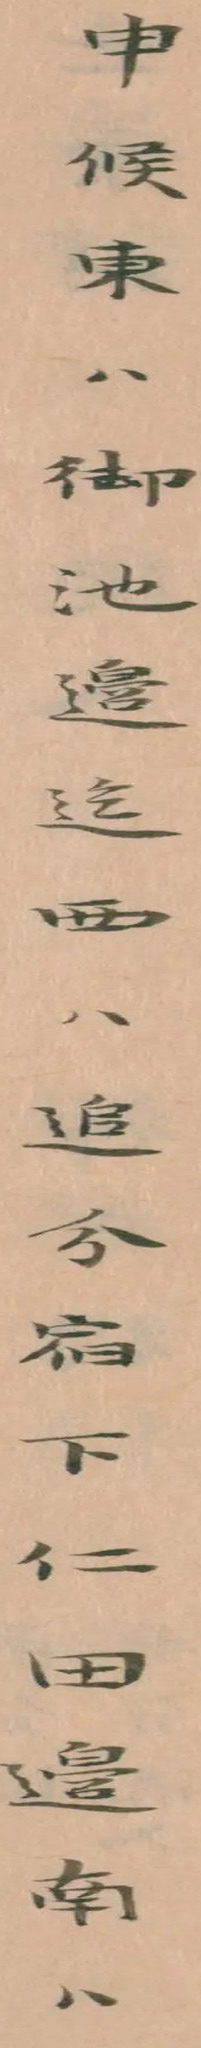申候東ハ御池辺迄西ハ追分宿下仁田辺南ハ
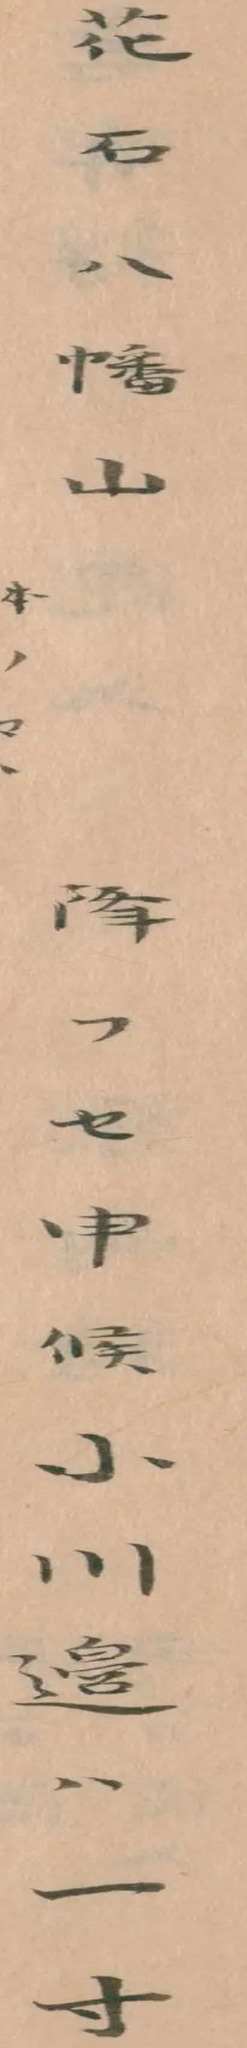花石八幡山降フセ申候小川辺ハ一寸
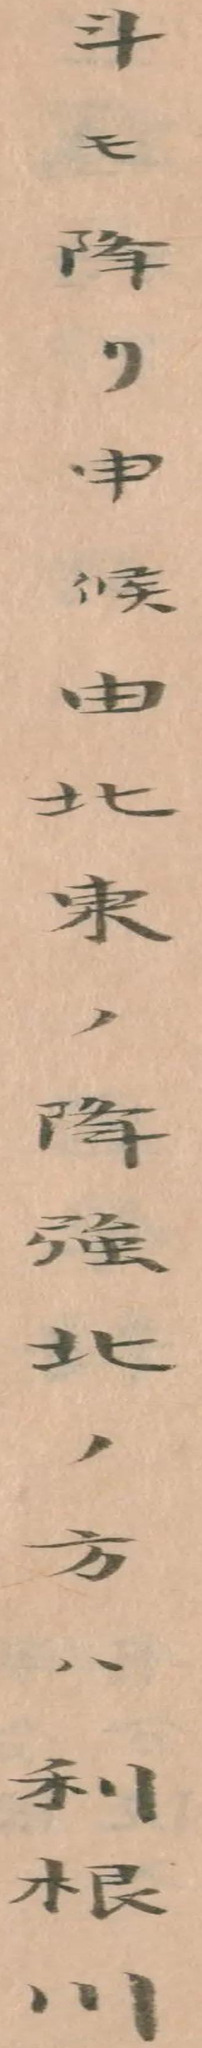斗モ降り申候由北東ノ降強北ノ方ハ利根川
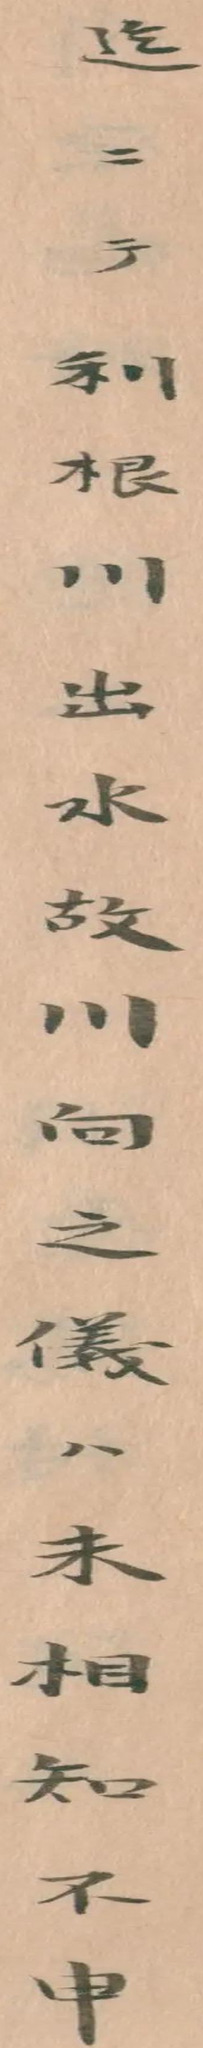辺ニテ利根川出水故川向之儀ハ未相知不申
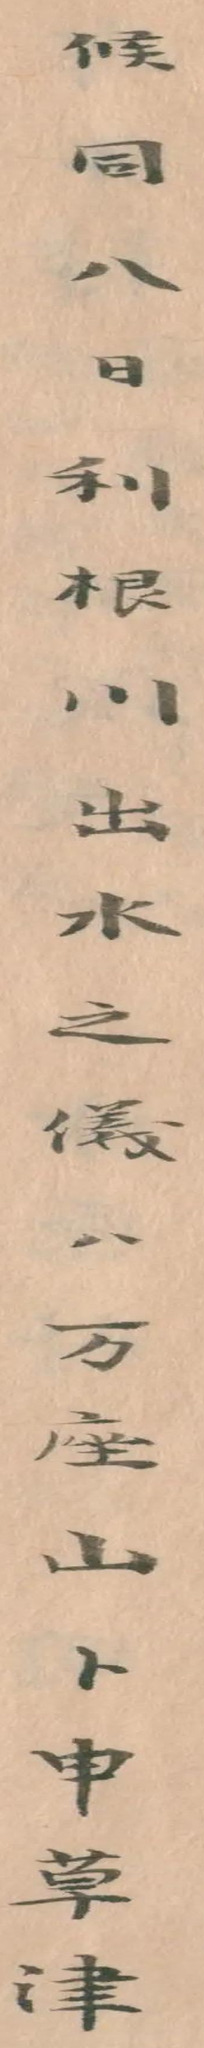候同八日利根川出水之儀ハ万座山ト申草津
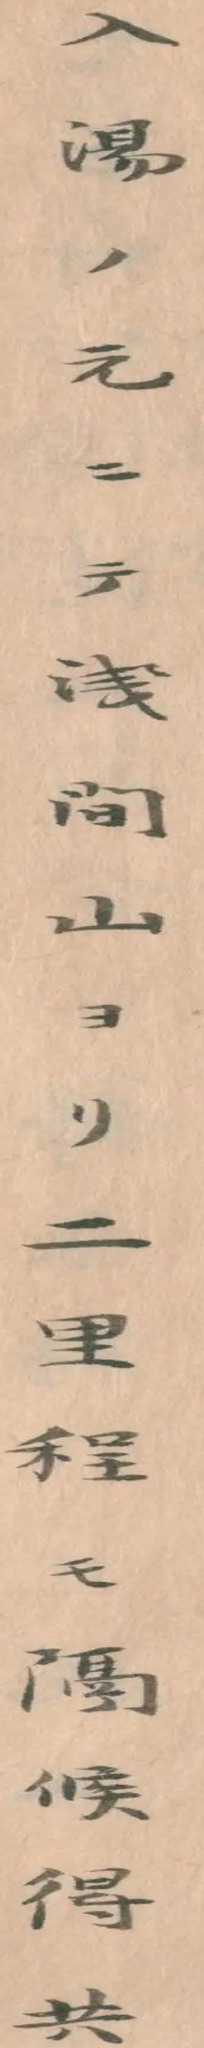入湯ノ元ニテ浅間山ヨリ二里程モ隔候得共
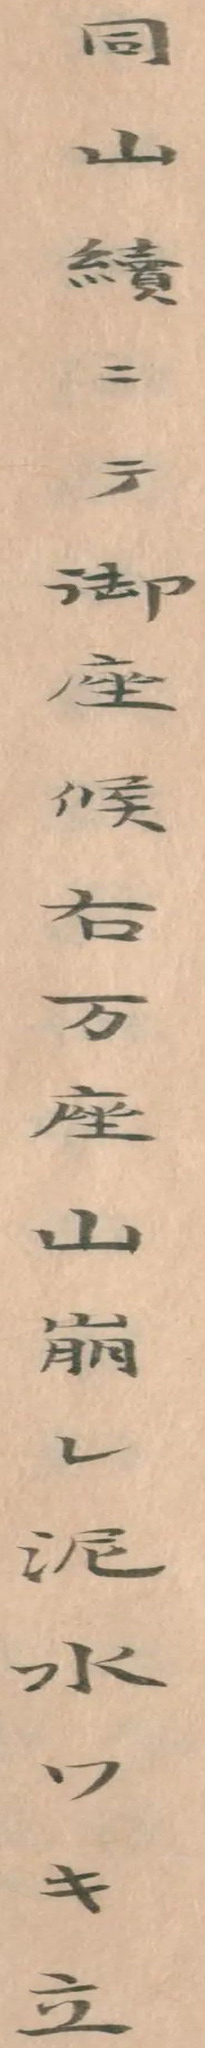同山続ニテ御座候右万座山崩レ泥水ワキ立
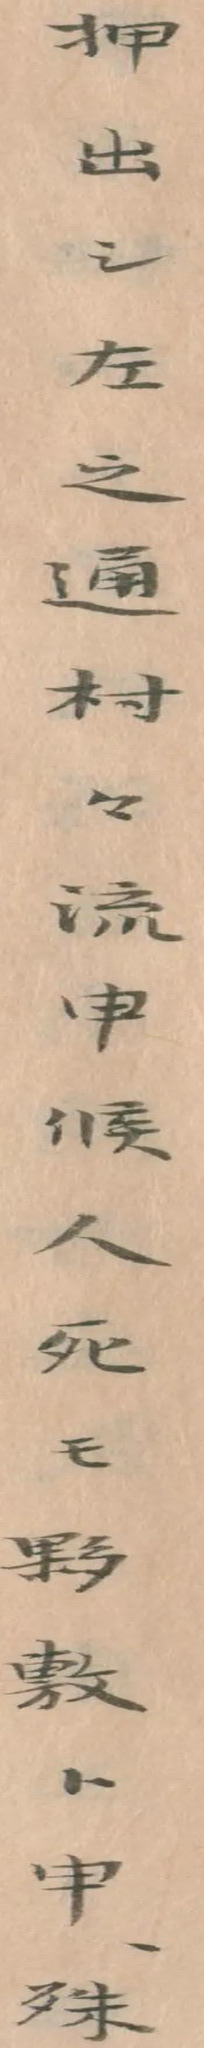押出シ左之通村々流申候人死モ夥敷ト申殊
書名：地災撮要. 巻1(噴火山・地震ノ部)
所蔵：国立国会図書館 National Diet Library, JAPAN
